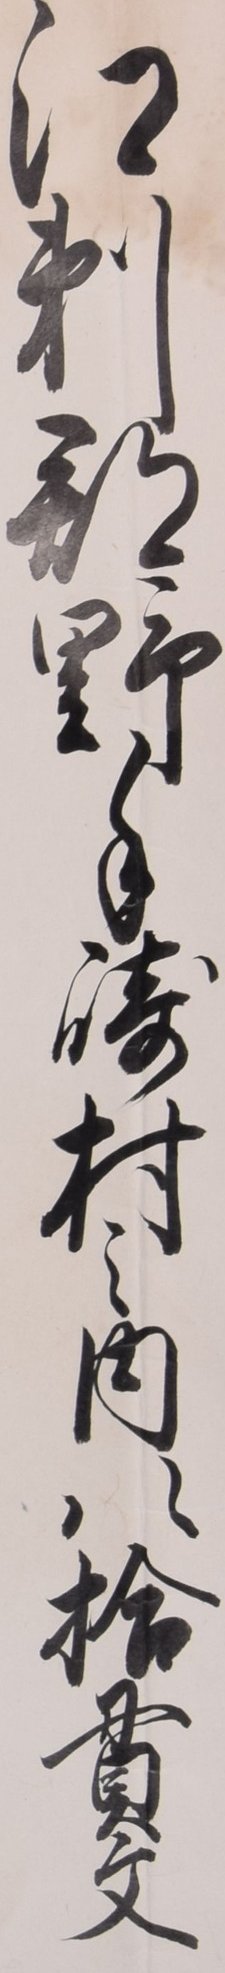江刺郡野手崎村之内八拾貫文
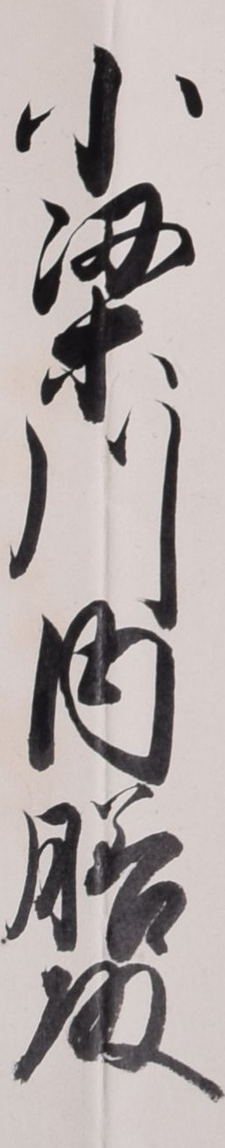小梁川内膳殿
